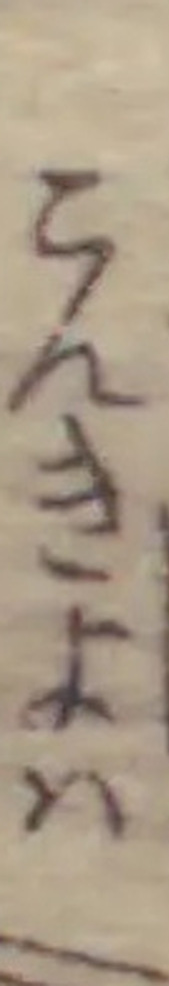こんきよは
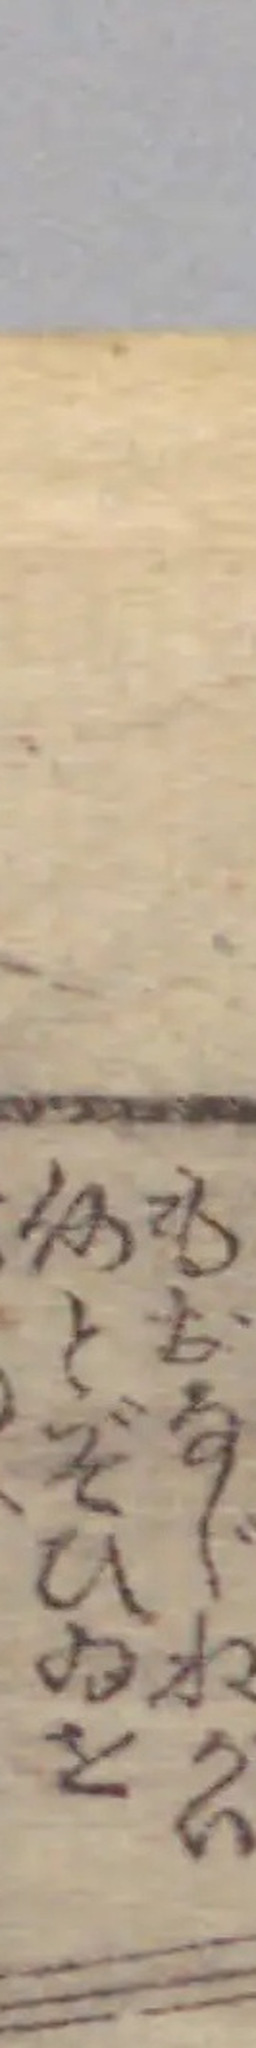何とぞひゐを
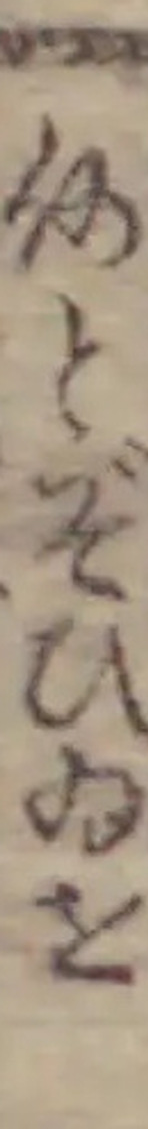何とぞひゐを
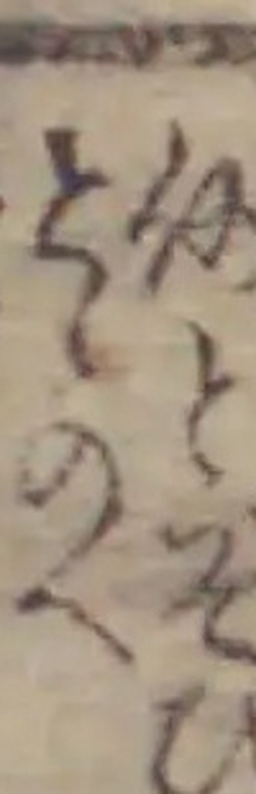とゝのへ
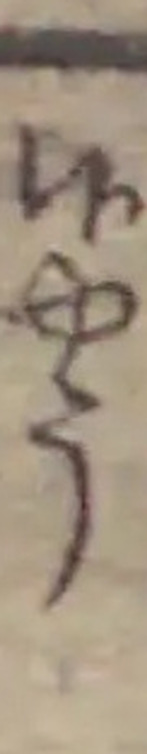候やう
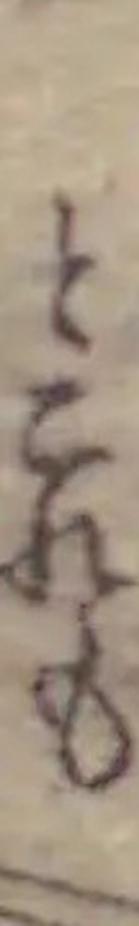とこれも
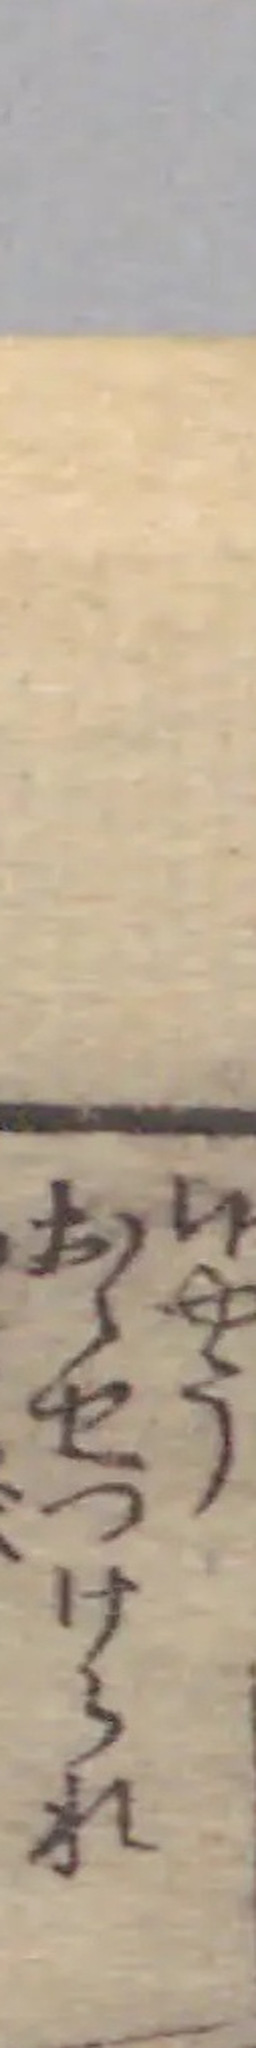おゝせつけられ
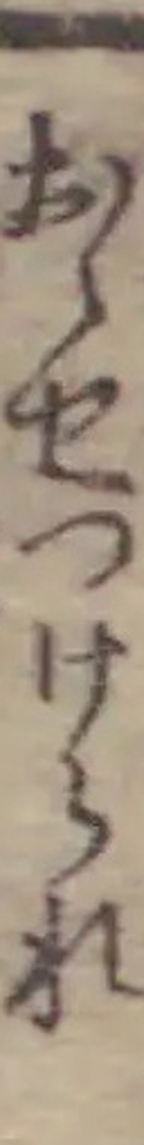おゝせつけられ
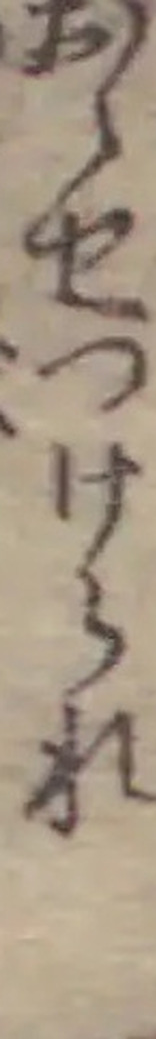おゝせつけられ
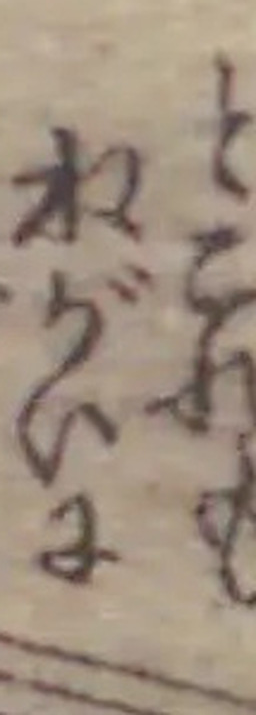ねがいに
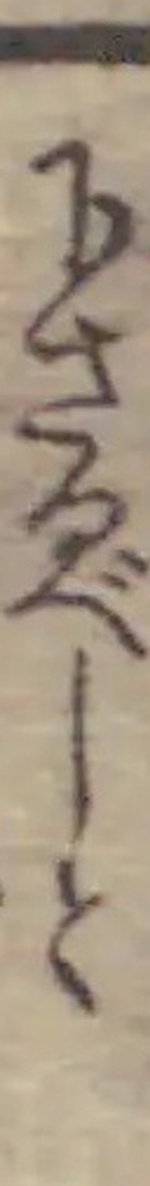下さるべしと
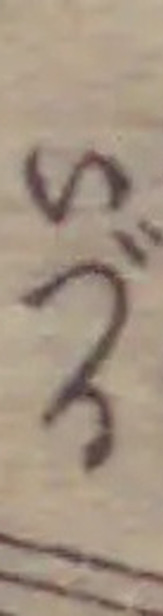いづる
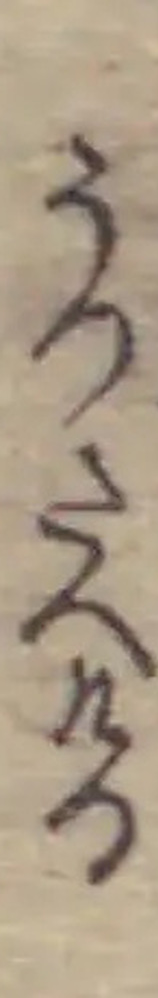うつたへける

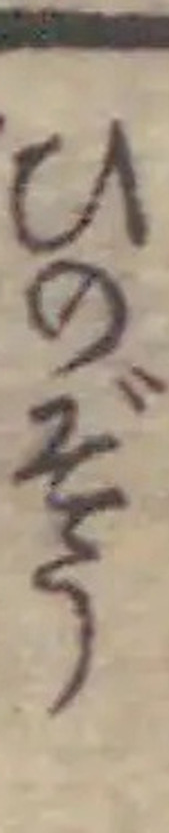ひのぞう
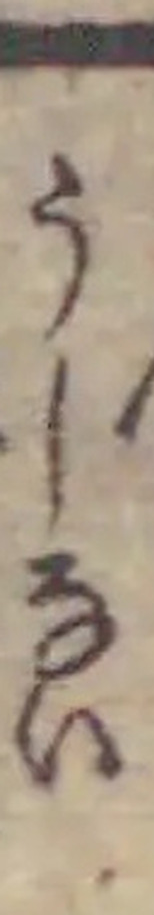うしない
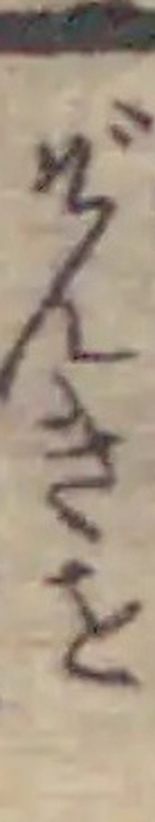げんきを
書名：腹内養生主論 3巻
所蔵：国立国会図書館 National Diet Library, JAPAN
